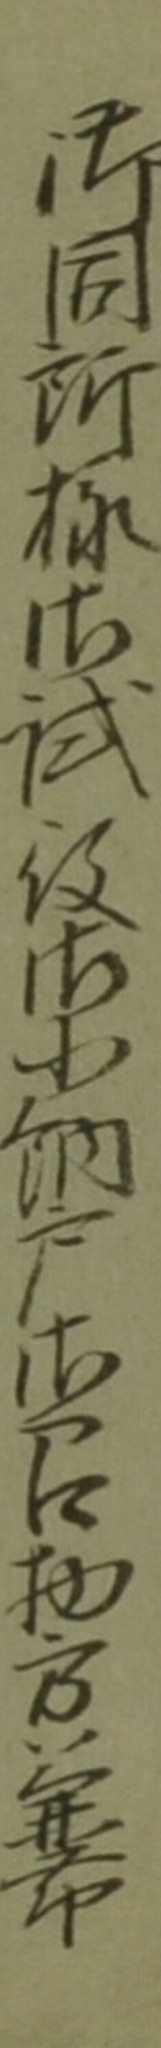御同所様御試役御小納戸御召物方兼帯
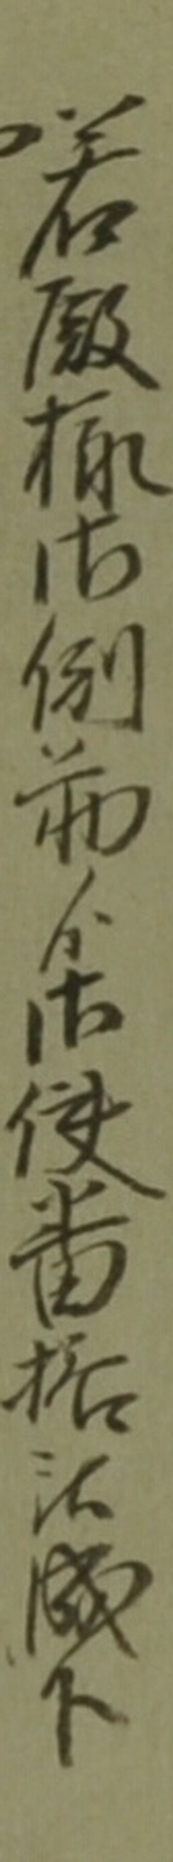若殿様御側勤ゟ御使番格被成下
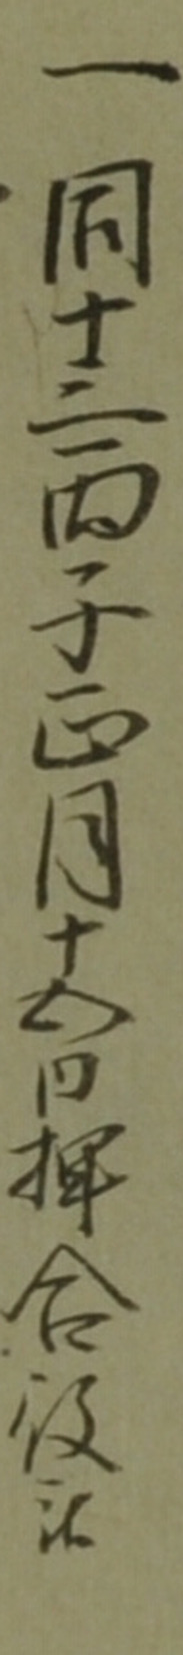一同十三丙小正月十五日押合役被
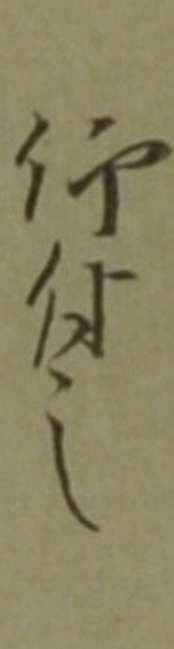仰付之
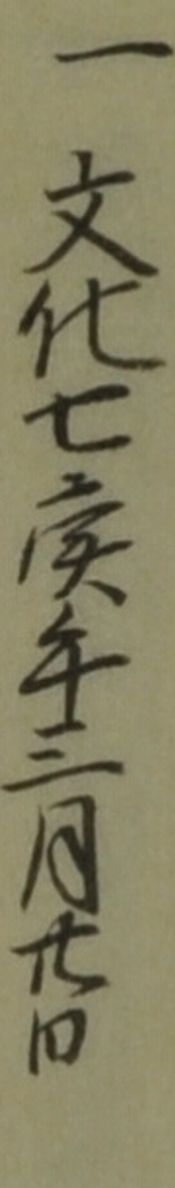一文化七庚午三月廿日
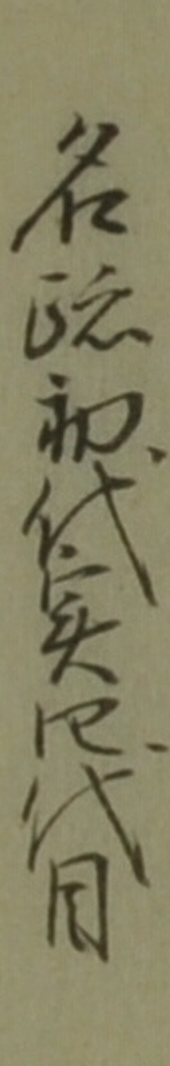名跡初代実四代目
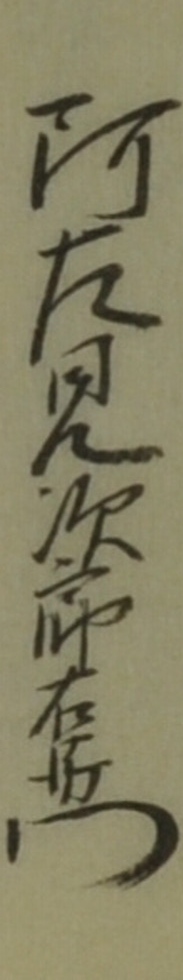阿左見次郎右衛門
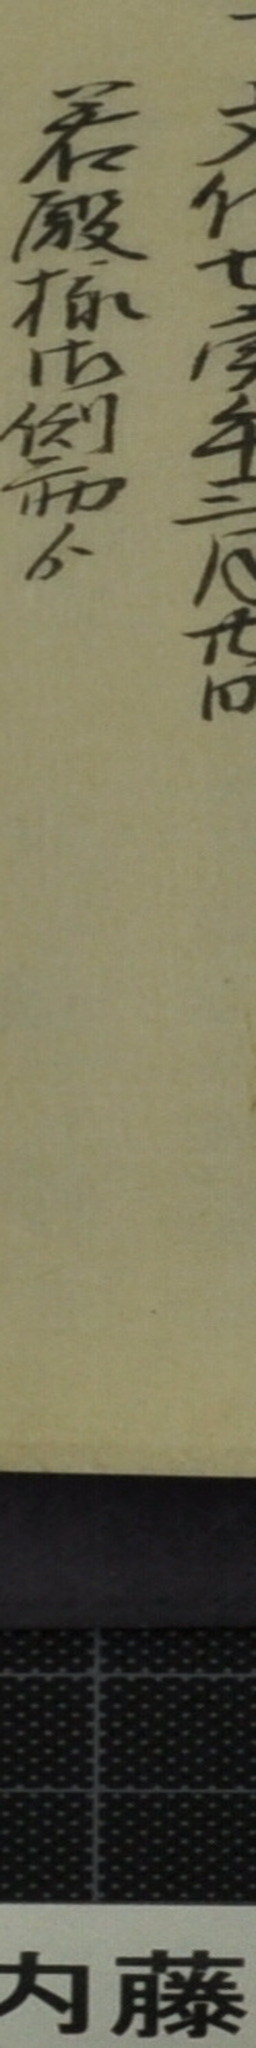若殿様御側勤ゟ
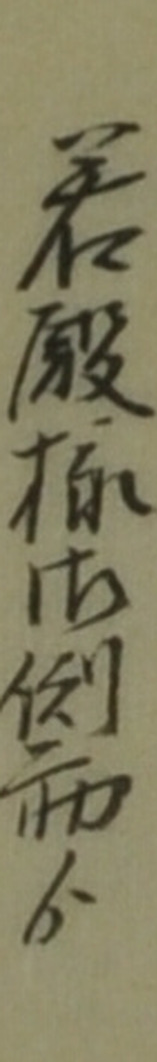若殿様御側勤ゟ
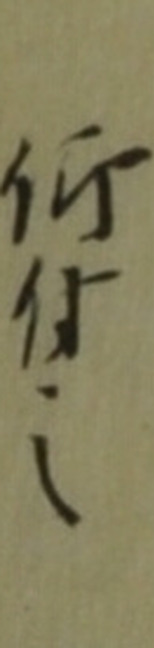仰付之
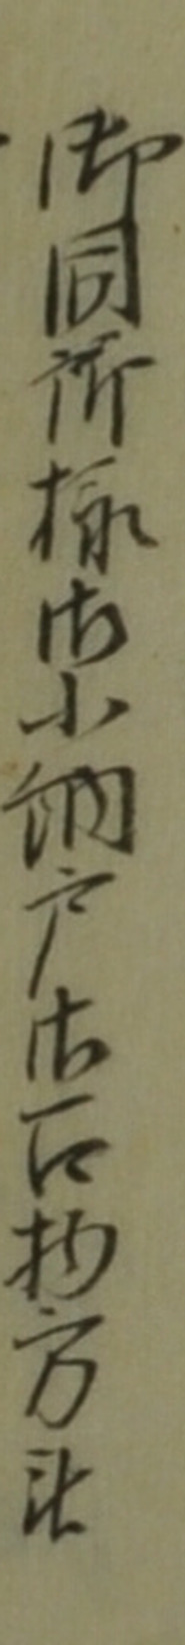御同所様御小納戸御召物方被
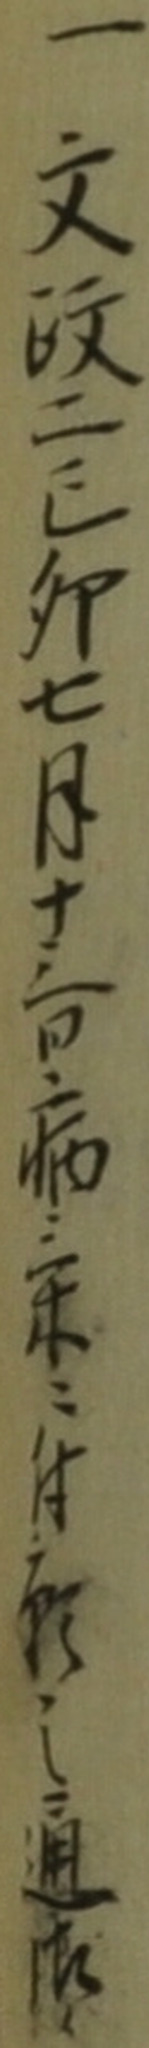一文政二巳卯七月十三日病気二付願之通御
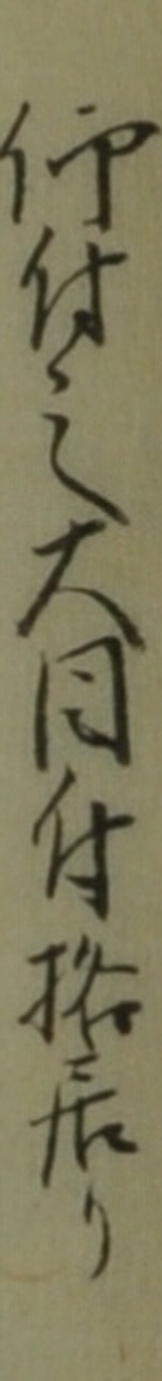仰付之大目付格居リ
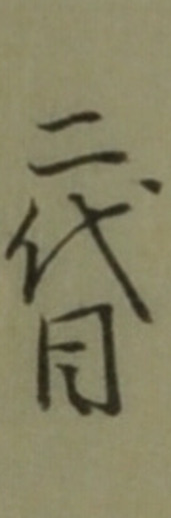二代目
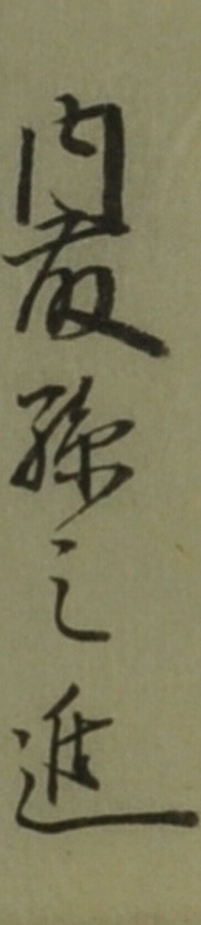内藤孫之進
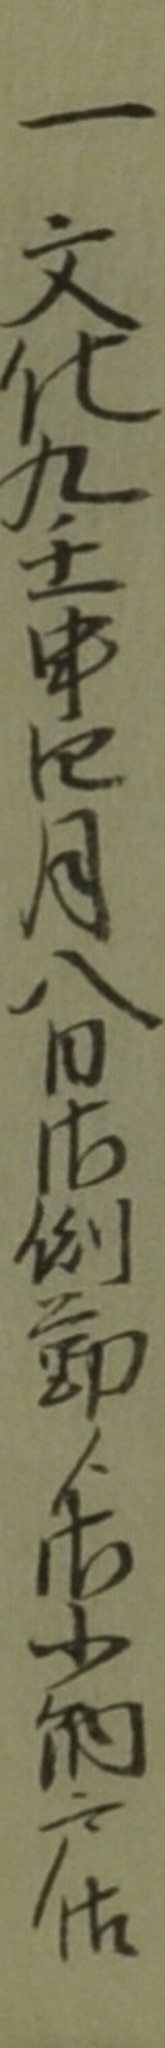一文化九壬申四月八日御側勤ゟ御小納戸御
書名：諸御役代々録（四）
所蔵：伊那市立高遠町図書館・合同会社AMANE
